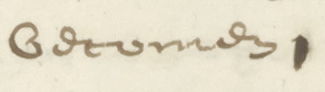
becomen.
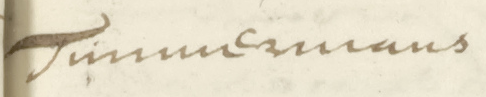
Timmermans
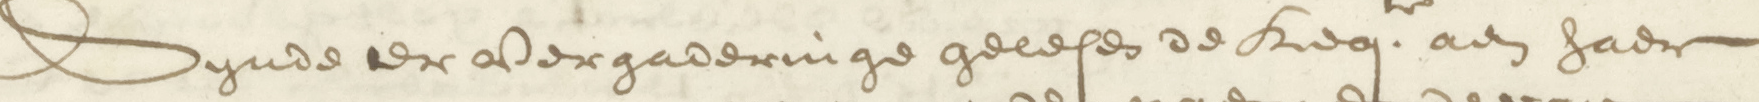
Synde ter Vergaderinge gelesen de Reqte. aen haer
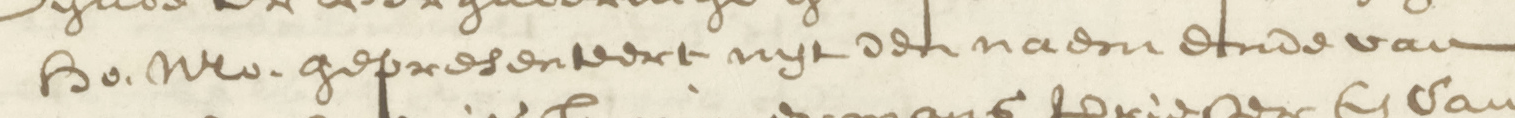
Ho:Mo: gepresenteert uyt den naem ende van
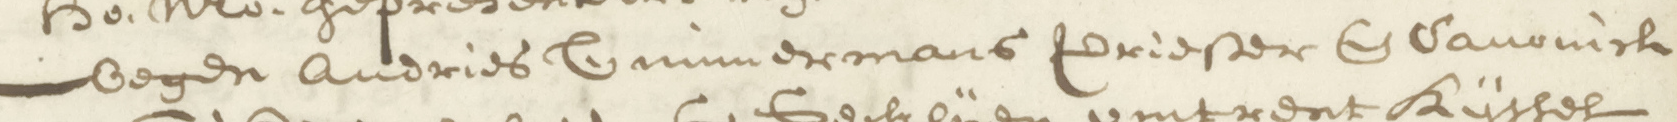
wegen Andries Timmermans Priester & Canonick
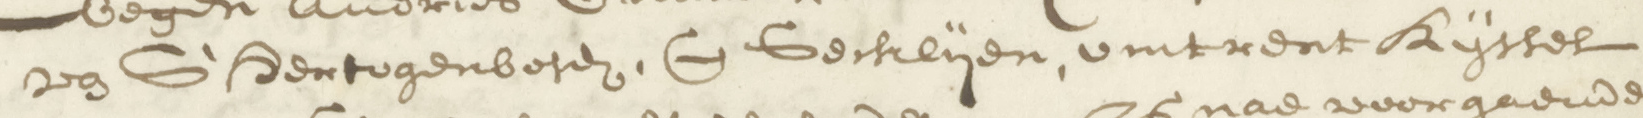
van S‛Hertogenbosch, & Secklijen, omtrent Rijssel
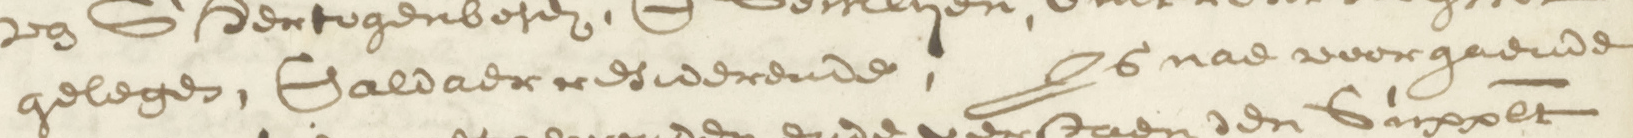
gelegen, & aldaer residerende, Is nae voorgaende
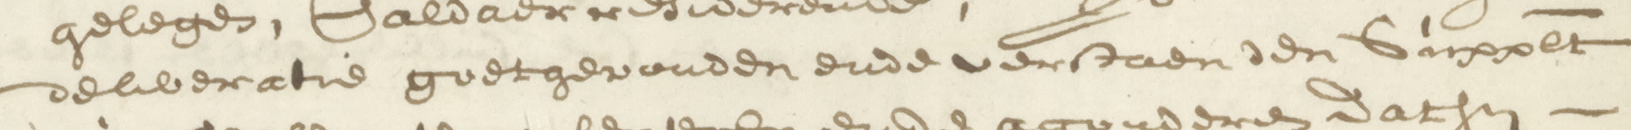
deliberatie goetgevonden ende verstaen den Supplt.
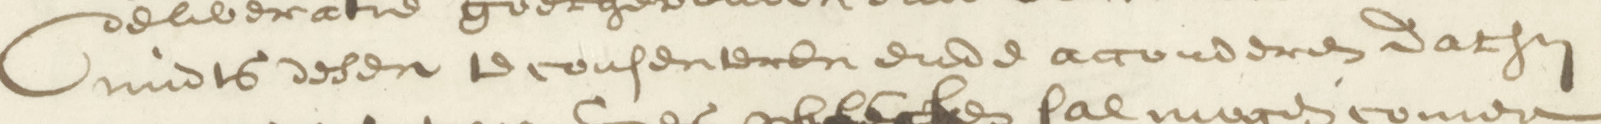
midts desen te consenteren ende accorderen dat hy
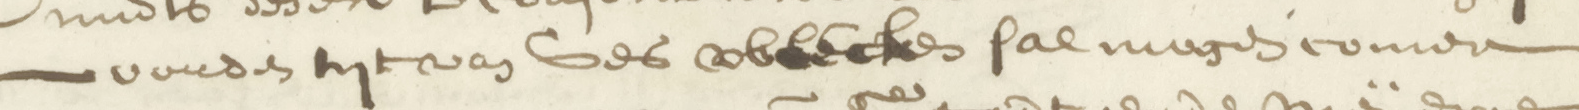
voorden tyt van Ses weecken sal mogen comen
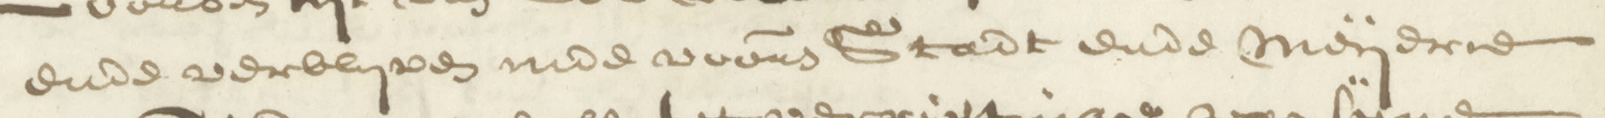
ende verblyven inde voorn Stadt ende meijerie
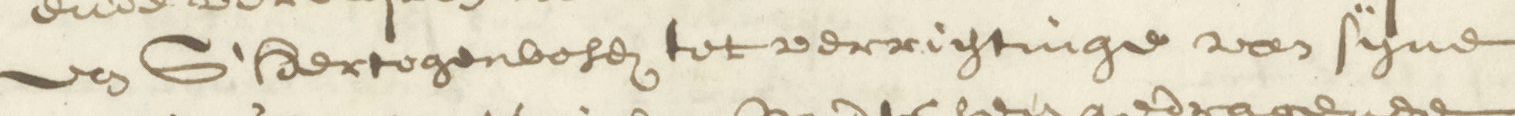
van S'Hertogenbosch tot verrichtinge van sijne
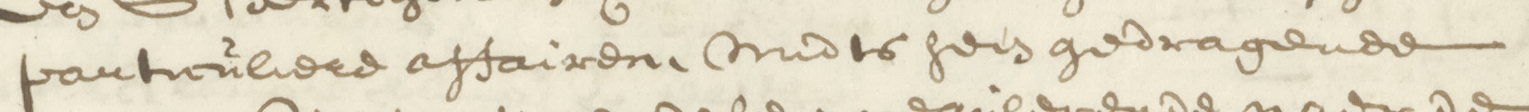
particuliere affairen, Midts hem gedragende
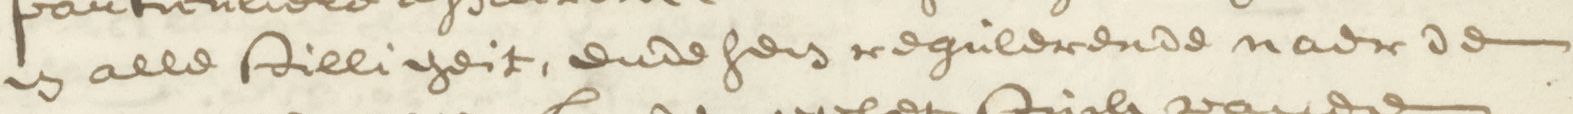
in alle stillicheit, ende hem regulerende naer de
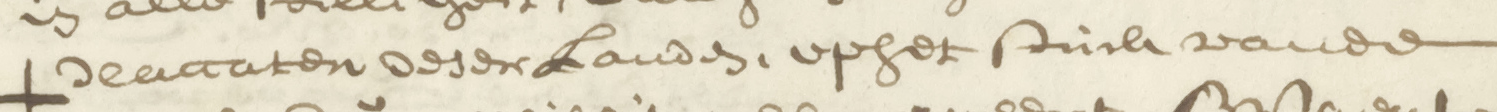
Placcaten deser Landen, op het stuck vande
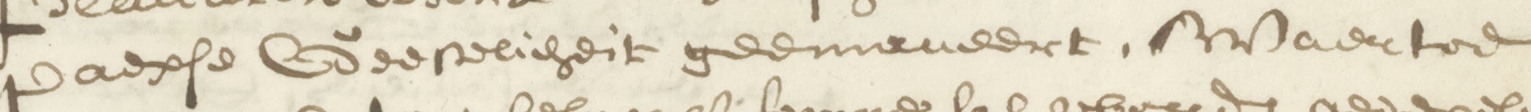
Paepse Geestelicheit geemaneert, Waertoe
